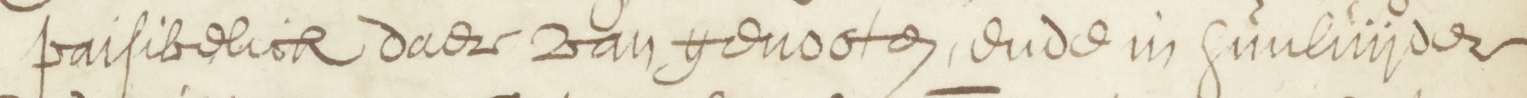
paisibelick daer van genooten, ende in hunluijder
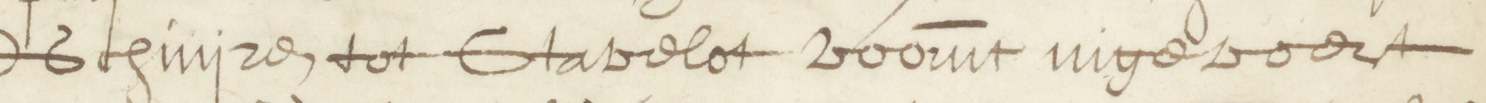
Schuijren tot Stavelot voornt ingevoert
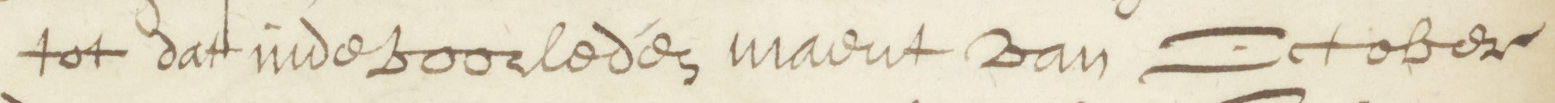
tot dat inde voorleden maent van October
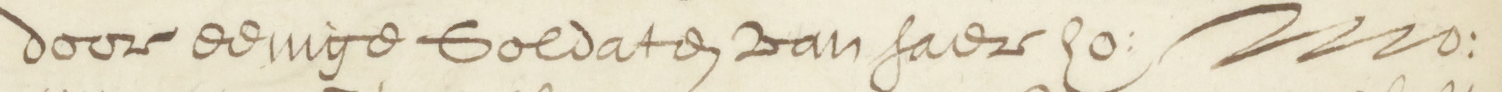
door eenige Soldaten van haer ho:Mo:
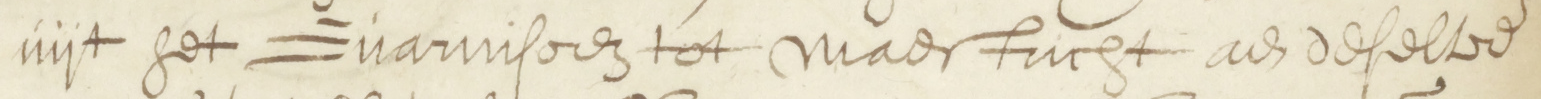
uijt het Guarnisoen tot maestricht aen deselve
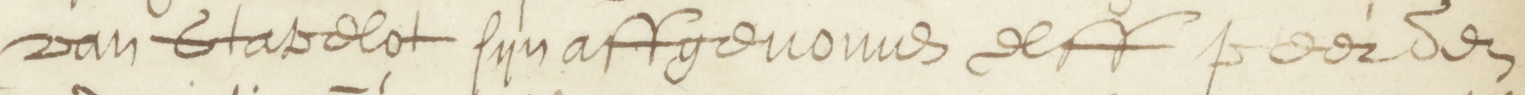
van Stavelot sijn affgenomen elff peerden
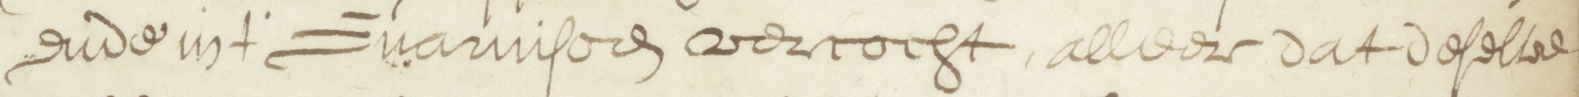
ende in t‛ Guarnisoen vercocht, alleer dat deselve
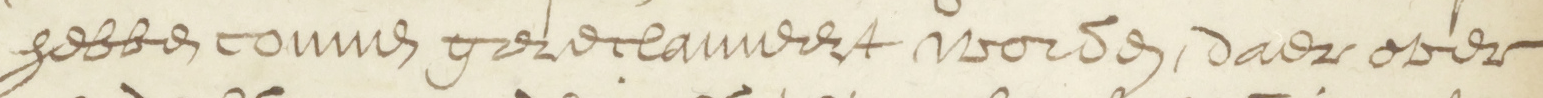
hebben connen gereclameert worden, daer over
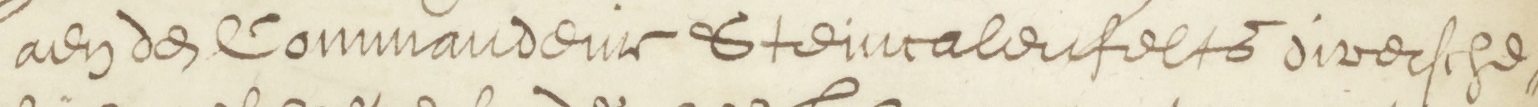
aen den Commandeur Steincalenfelts diversche„
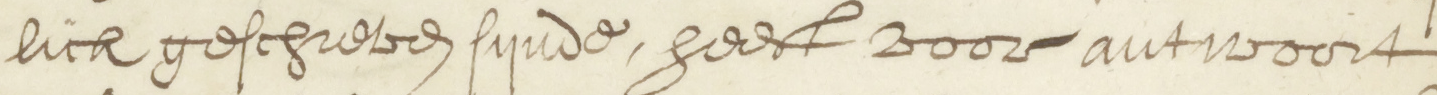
lick geschreven sijnde, heeft voor antwoort
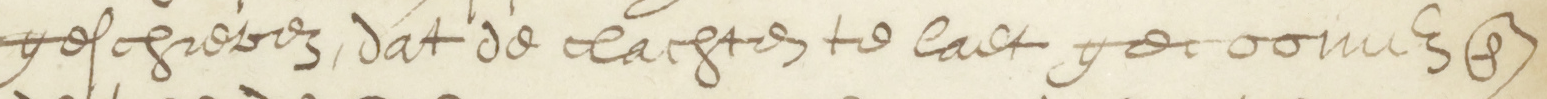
geschreven, dat de clachten te laet gecoomen &
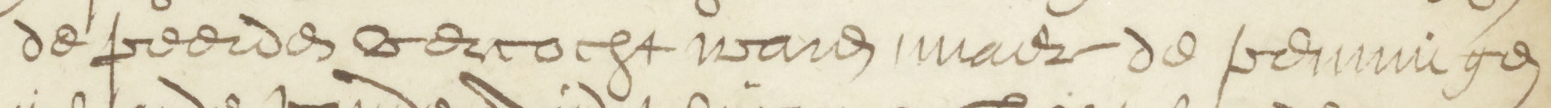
de peerden vercocht waren, maer de penningen
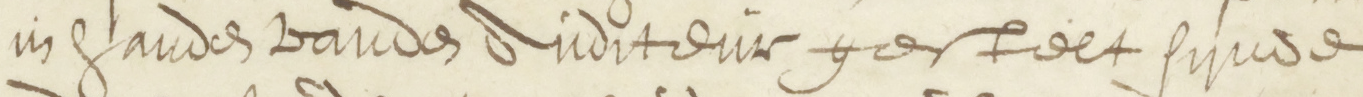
in handen vanden Auditeur gestelt sijnde
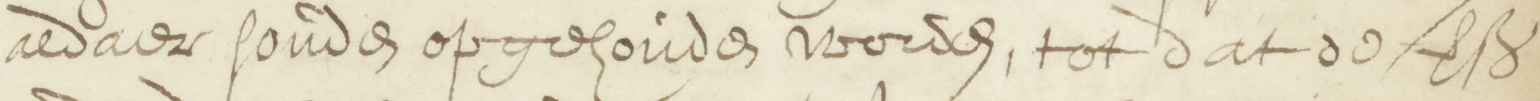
aldaer souden opgehouden worden, tot dat de vss.
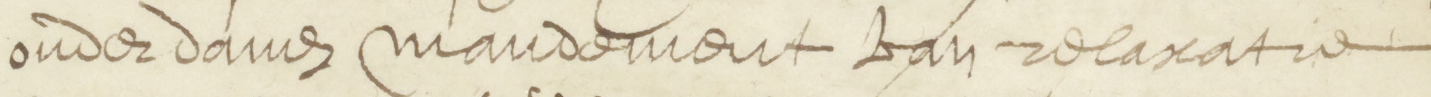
onderdanen mandement van relaxatie
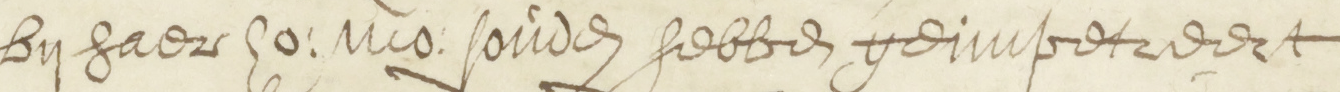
bij haer ho:Mo: souden hebben geimpetreert
